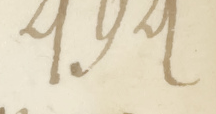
494
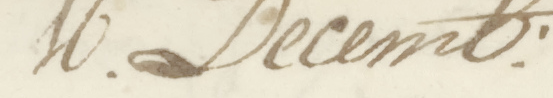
16. Decemb:
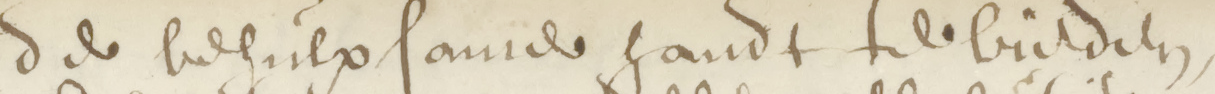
de behulpsame handt te bieden.
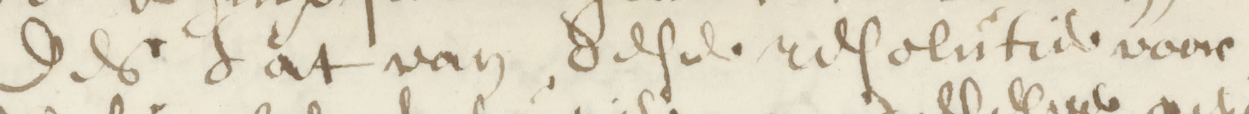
Des dat van dese resolutie voor
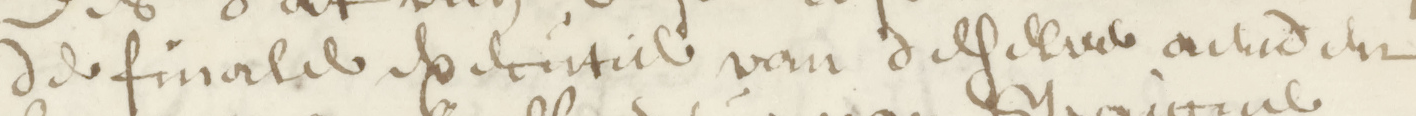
de finale executie van deselve aenden
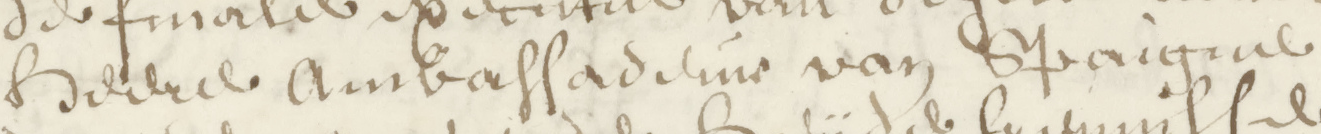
Heere Ambassadeur van Spaigne
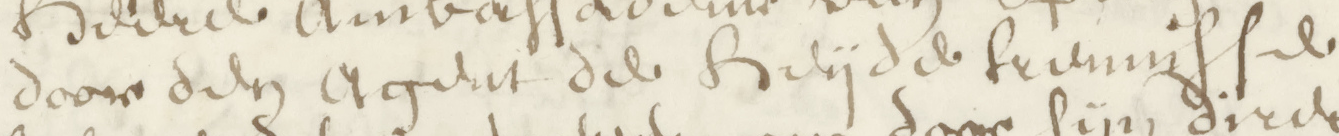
door den Agent de Heijde kennisse
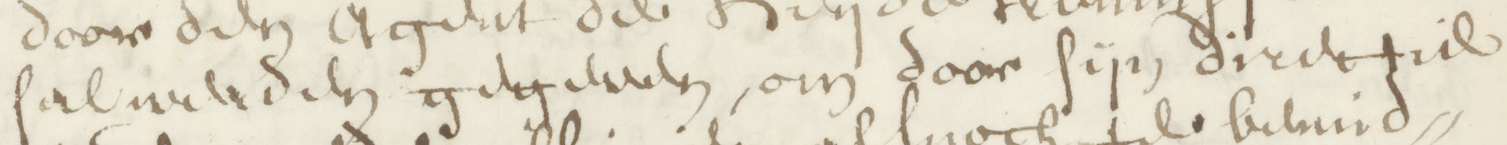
sal werden gegeven, om door sijn directie
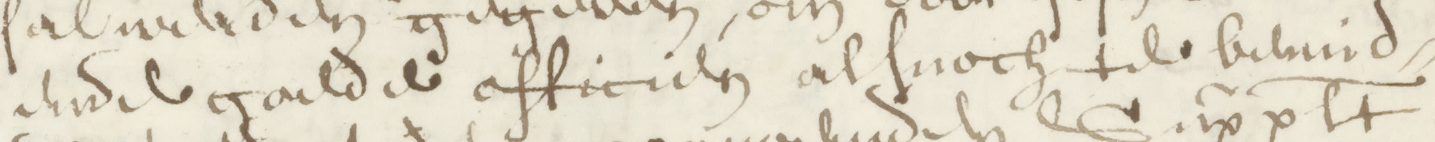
ende goede officien alsnoch te bemid„
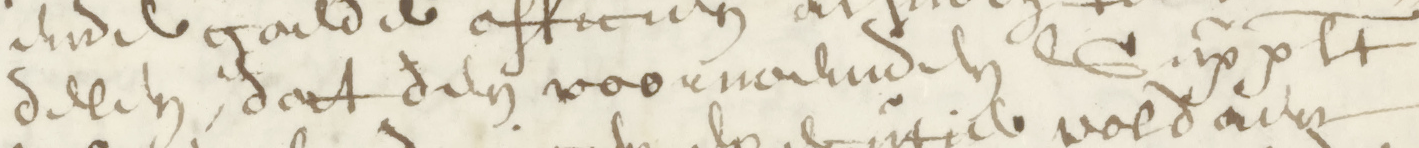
delen, dat den voornoemden Supplt
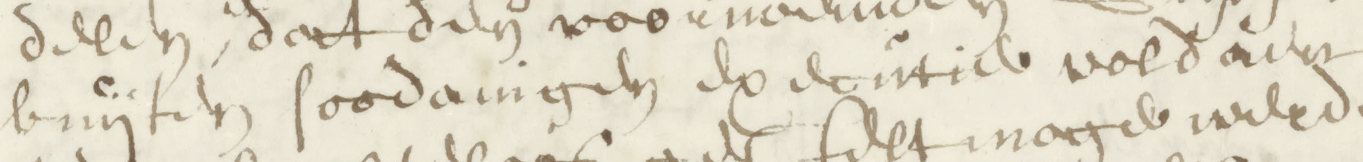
buijten soodanigen executie voldaen
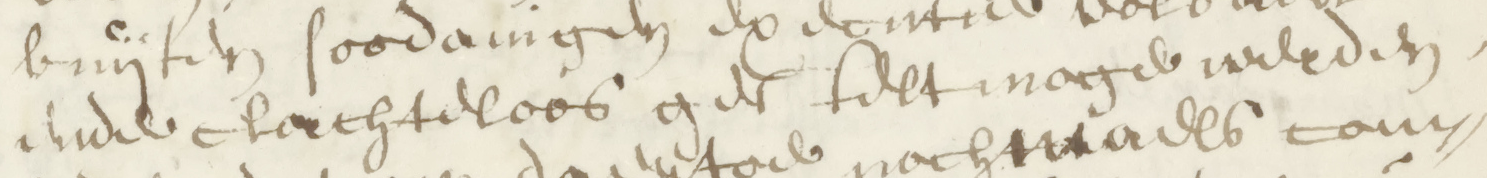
ende clachteloos gestelt moge werden,
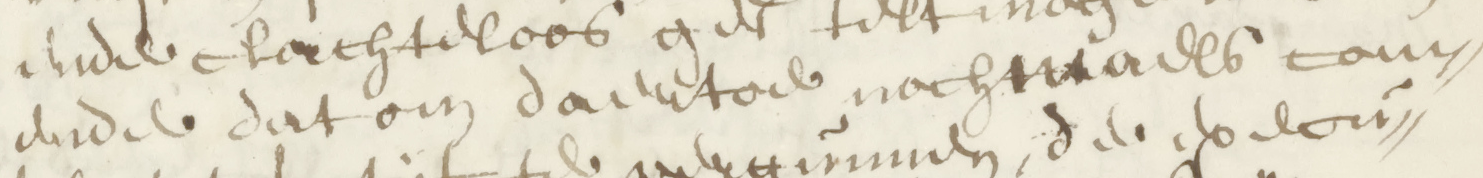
ende dat om daertoe nochmaels com„
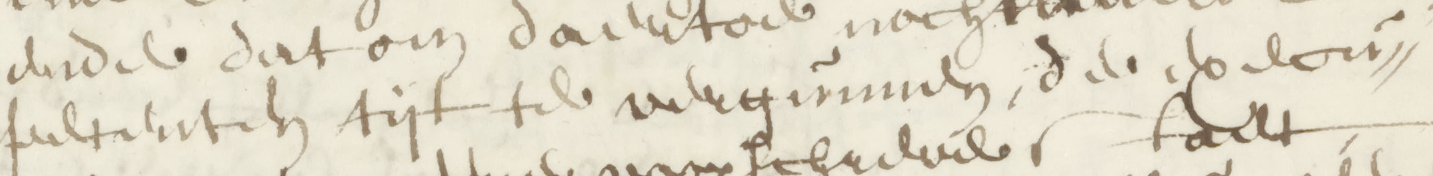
petenten tijt te vergunnen, de execu„
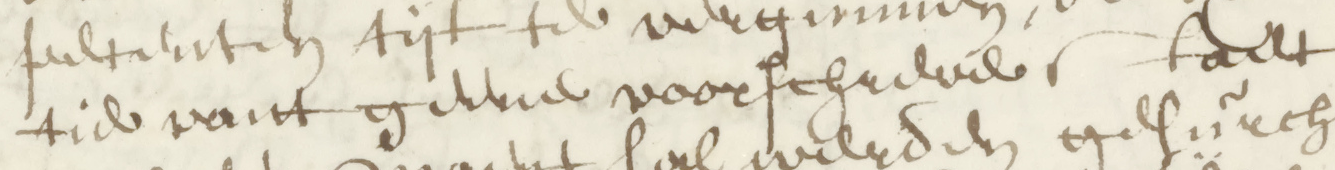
tie vant geene voorschreve staet,
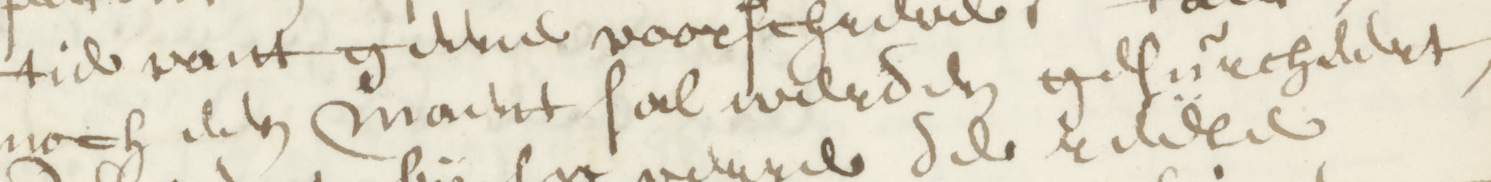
noch een maent sal werden gesurcheert.
